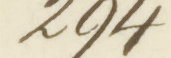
294
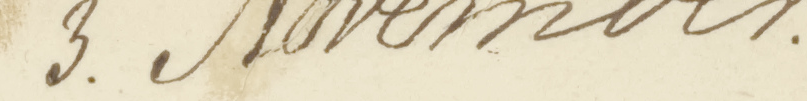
3. November.
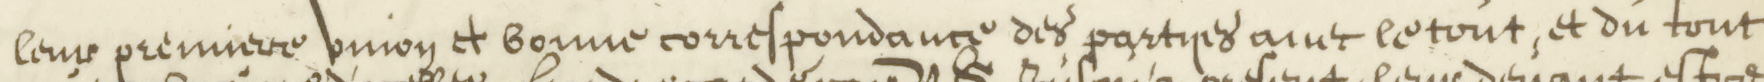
leur premiere union et bonne correspondance des partyes auec le tout, et du tout
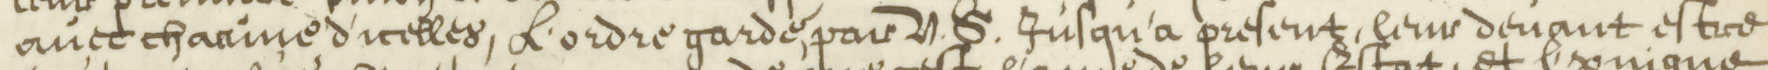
auec chacune d‛icelles, L‛ordre gardé par V.S. Jusqu‛a present, leur deuant estre
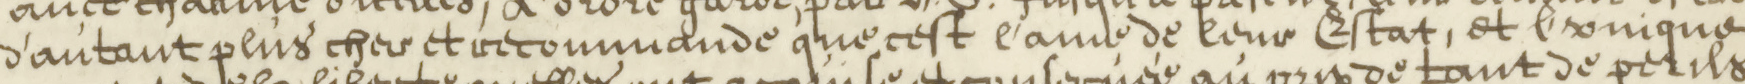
d'autant plus cher et recommande que cest l‛ame de leur Estat, et l‛vnique
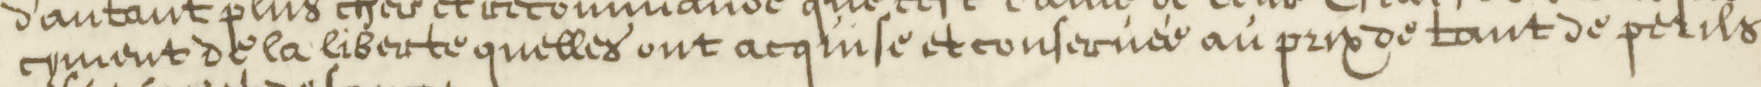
cyment de la liberte quelles ont acquise et conseruée au prix de tant de perils
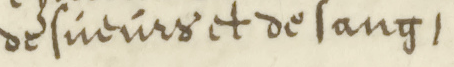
de sueurs et de sang.
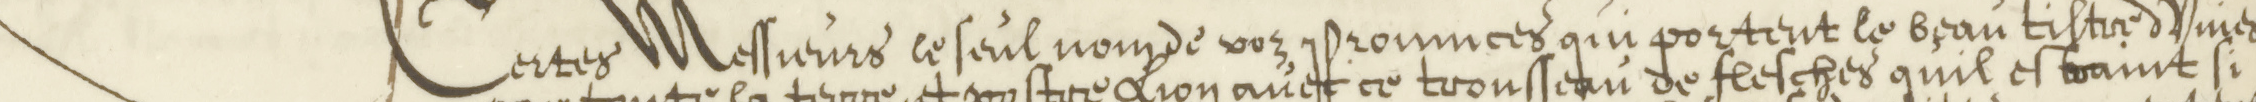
Certes Messieurs le seul nom de voz Prouinces qui portent le beau tiltre d‛Unies
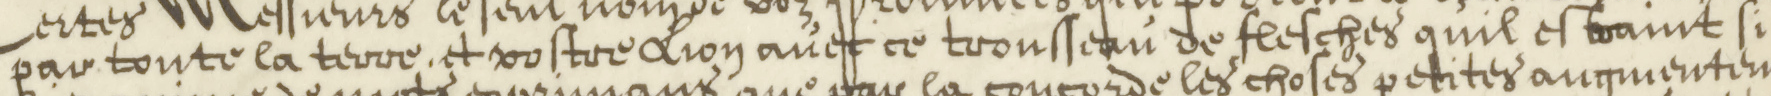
par toute la terre, et vostre Lion auec ce trousseau de flesches quil estraint si
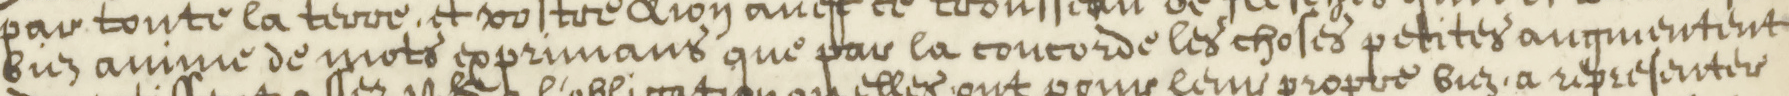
bien anime de mots exprimans que par la concorde les choses petites augmentent
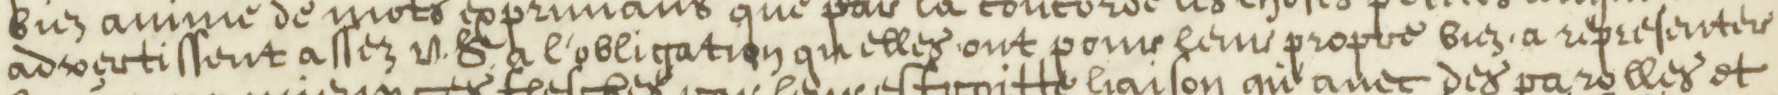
advertissent assez V.S. a l‛obligation quelles ont pour leur propre bien, a representer
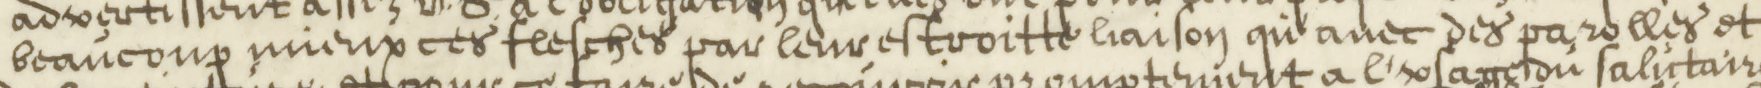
beaucoup mieux ces flesches par leur estroitte liaison qu‛auec des parolles et
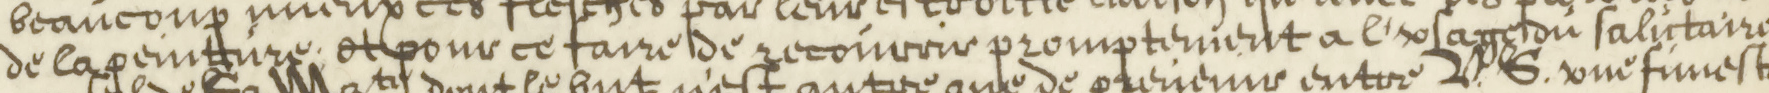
de la peinture, et pour ce faire de recouvrir promptement a l‛vsage du salutaire
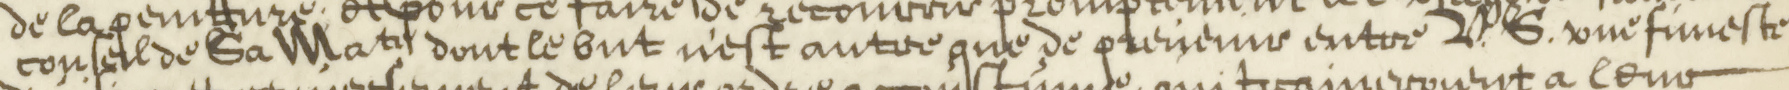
conseil de Sa Mate dont le but n‛est autre que de preuenir entre V.S. vne funeste
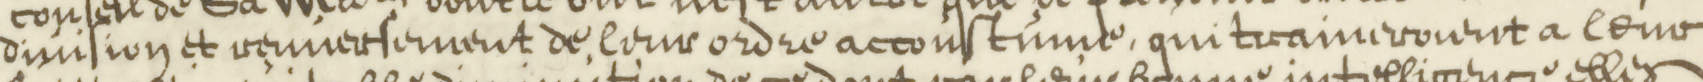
diuision et renuersement de leur ordre accoustume, qui trainerroient a leur
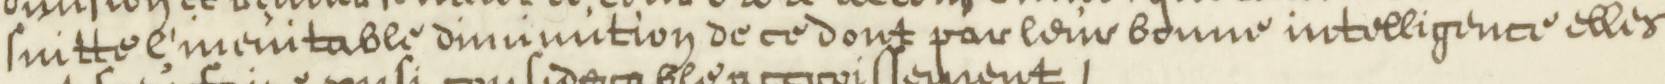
suitte l‛ineuitable diminution de ce dont par leur bonne intelligence elles
